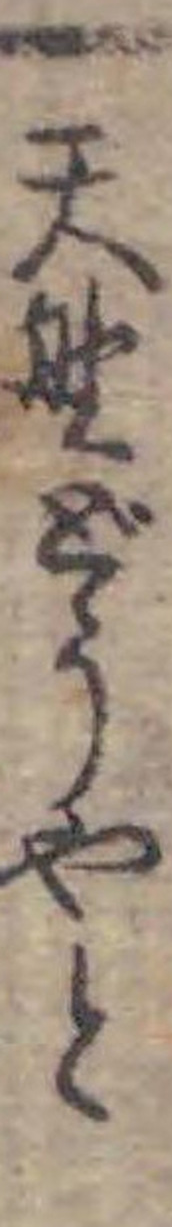天野どうやと
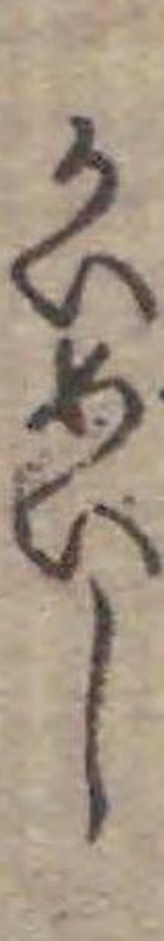かいめいし
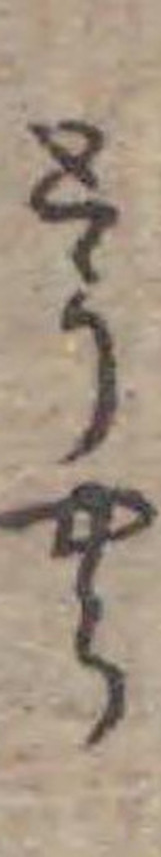とうやら
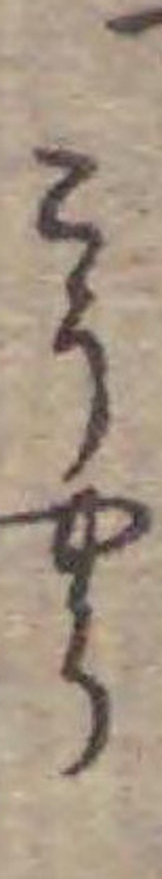こうやら
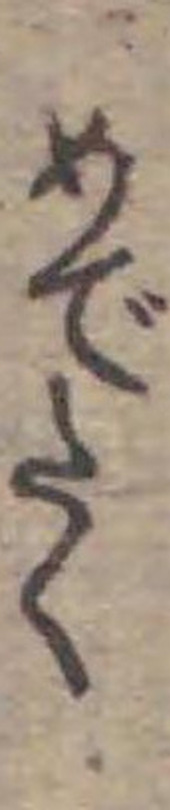めでたく
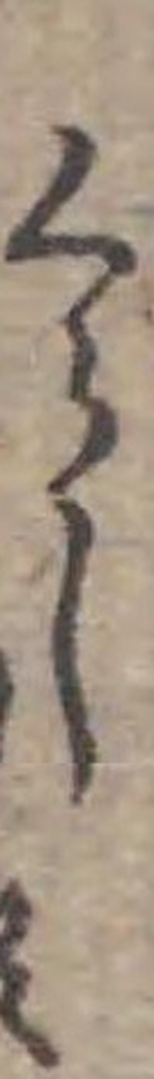くらし
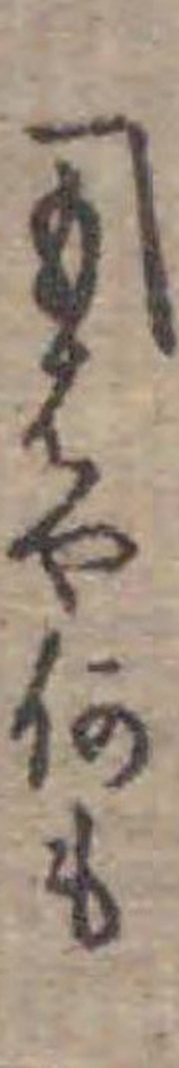〽もはや何も
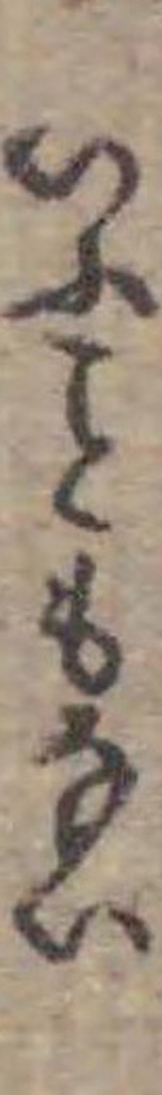いふこともない
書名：本樹真猿浮気噺 : 3巻
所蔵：国立国会図書館 National Diet Library, JAPAN
